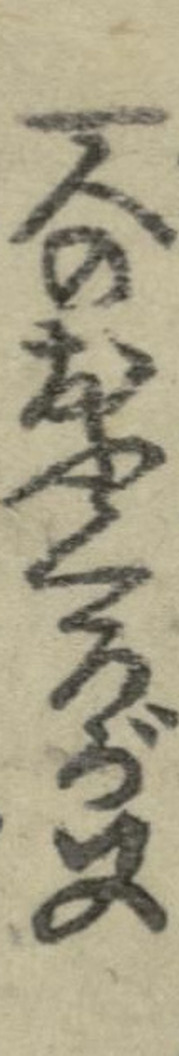一人のおふくろが又
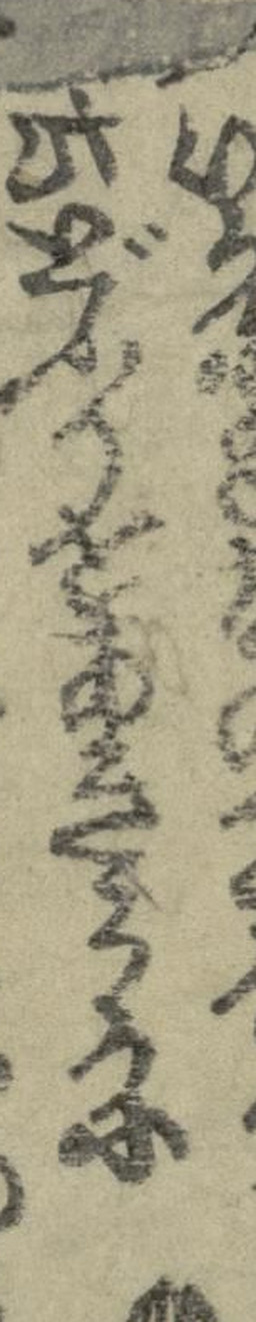此どふりをあきらかに
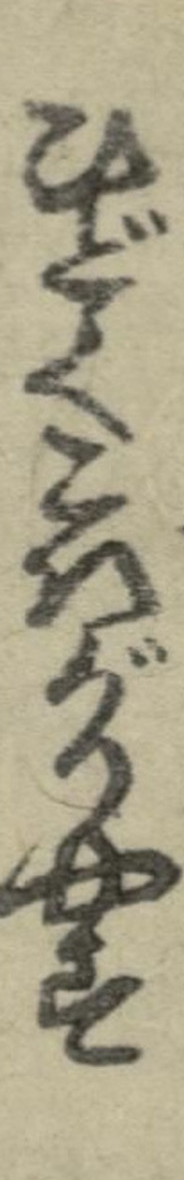ひどくこはがりやす
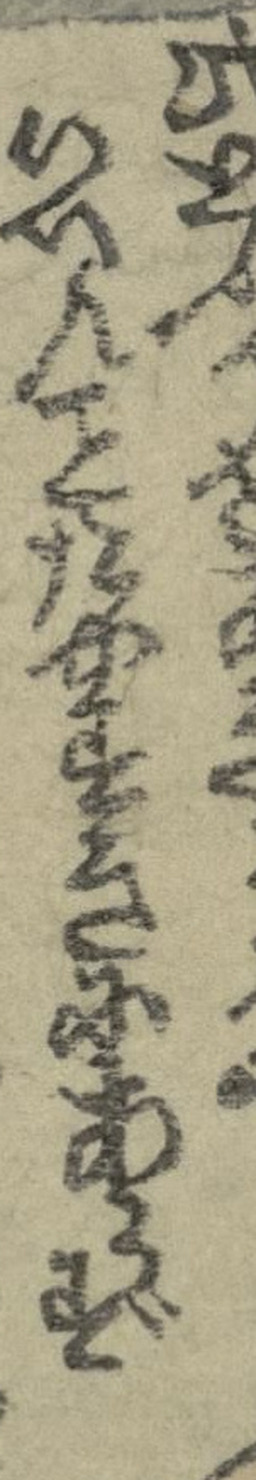いはんことたやすきにあらず
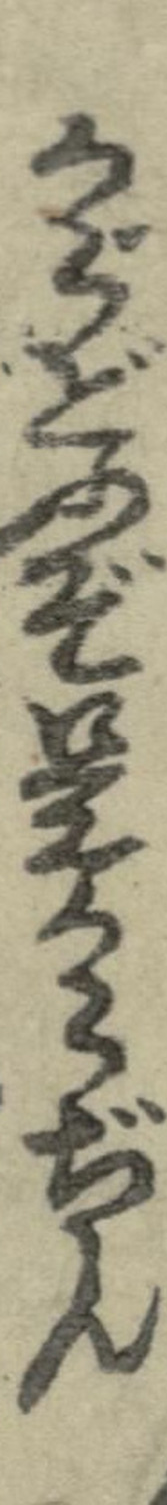からどふぞ是からぢしん
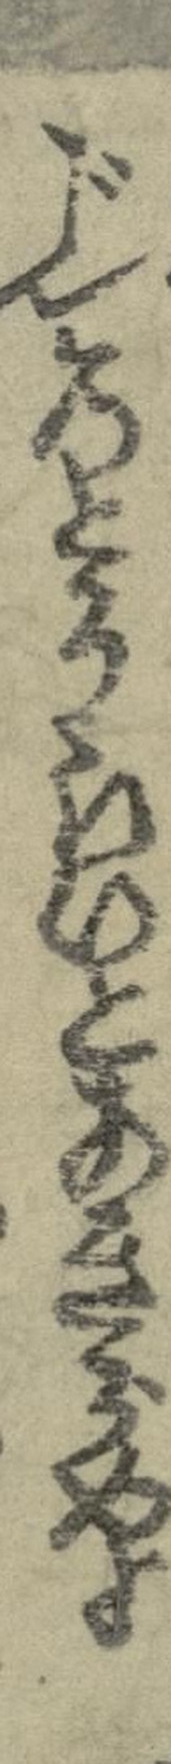じん道？とうらいとあきらめよ
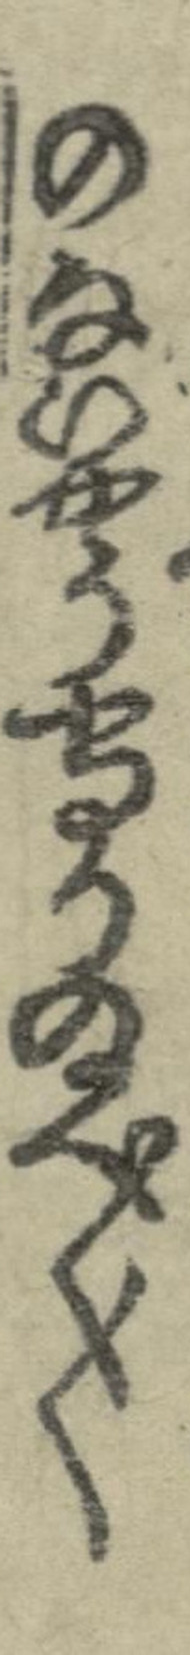のないやう守り給へ〳〵〳〵
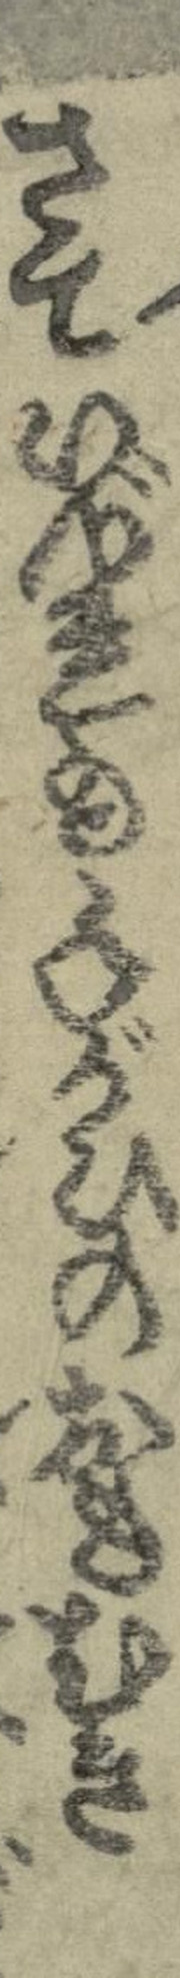さていづれもねがひのおもむき
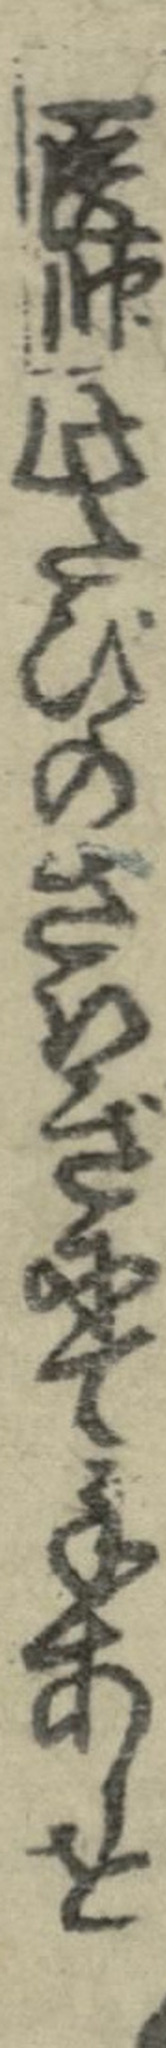医師此たびのさはぎにて手あしを
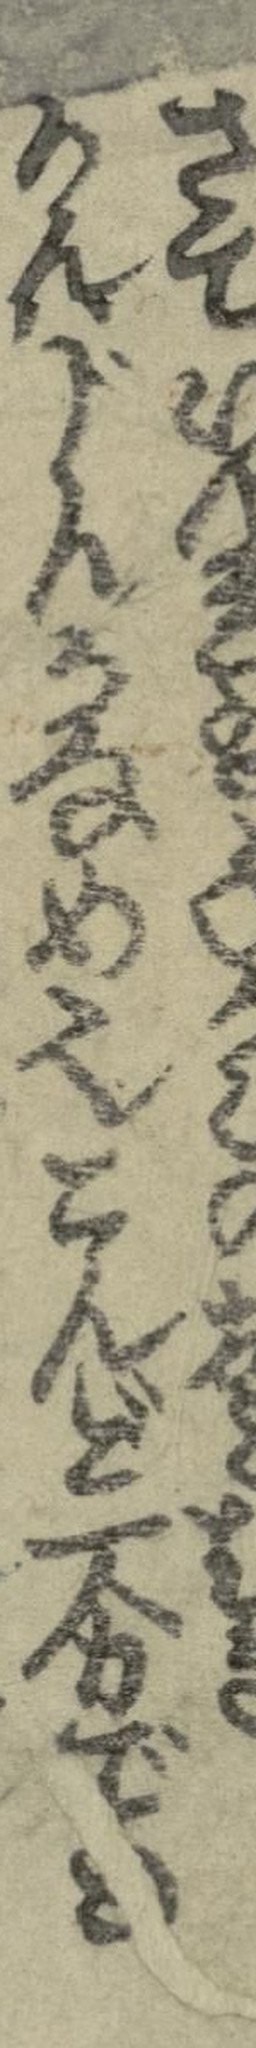かんじんかなめ也こんど一分でも？
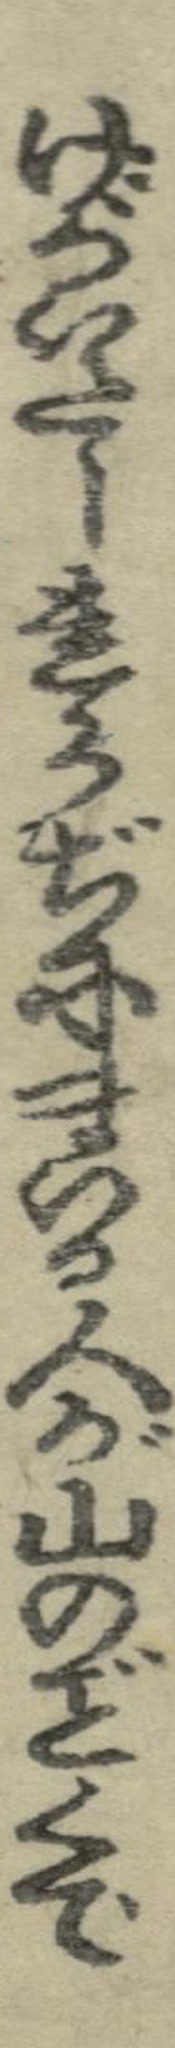けがいたしれうぢにまいる人が山のごとくで
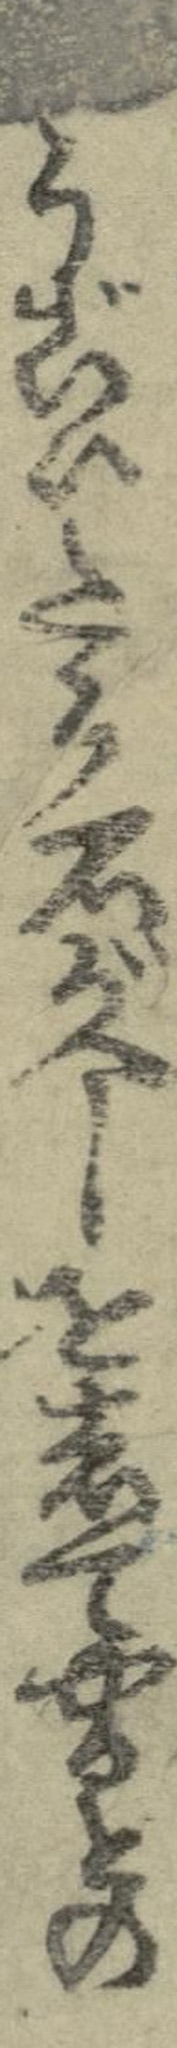うごいたら石がへしをしてやるとの
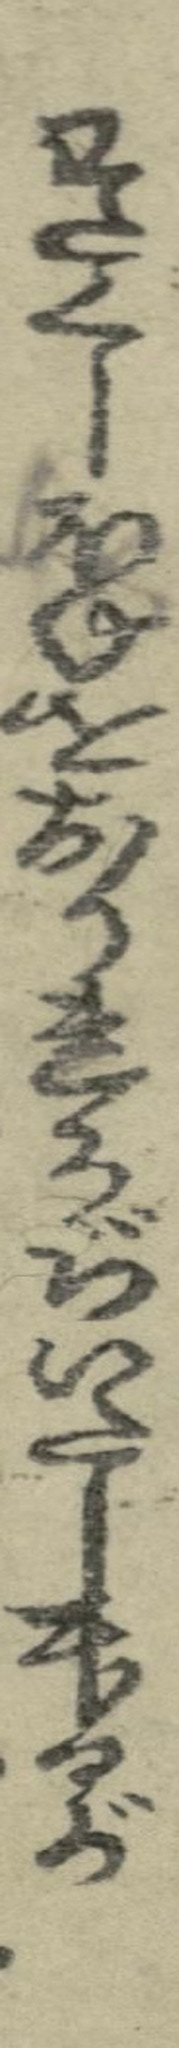わたくしほねをおりれうぢいたし升るが
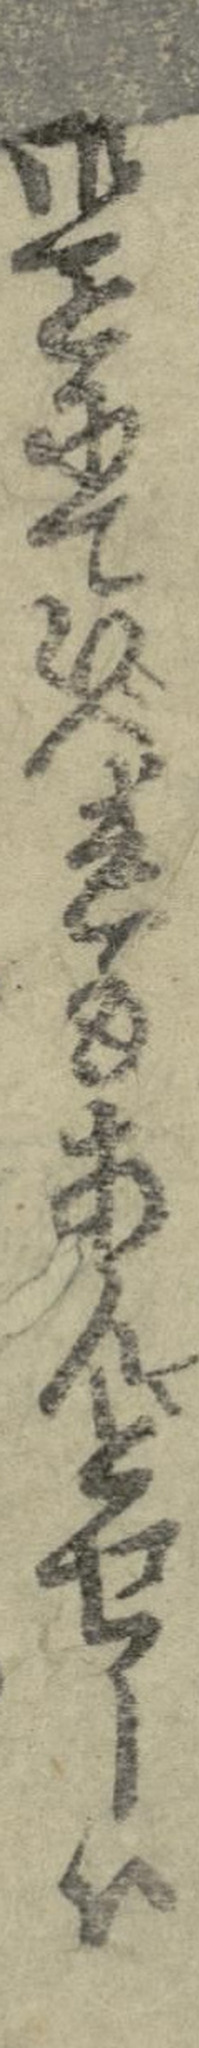御ことにていづれもあんどせしは
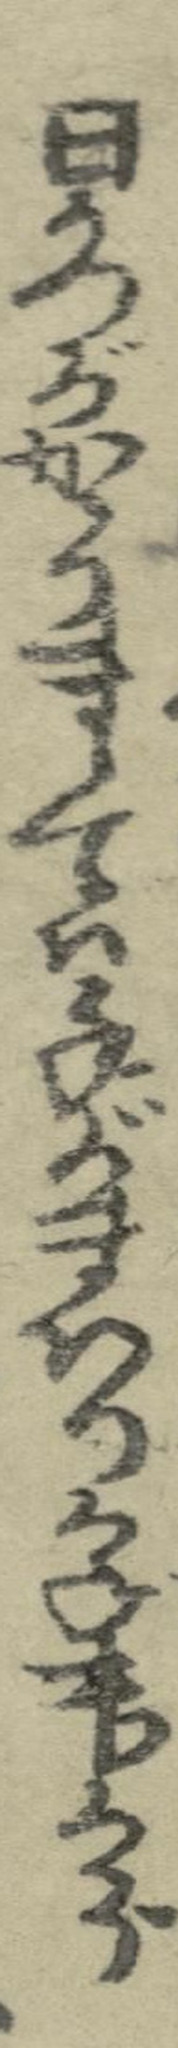日かつがかゝりましては手がまはりかね升から
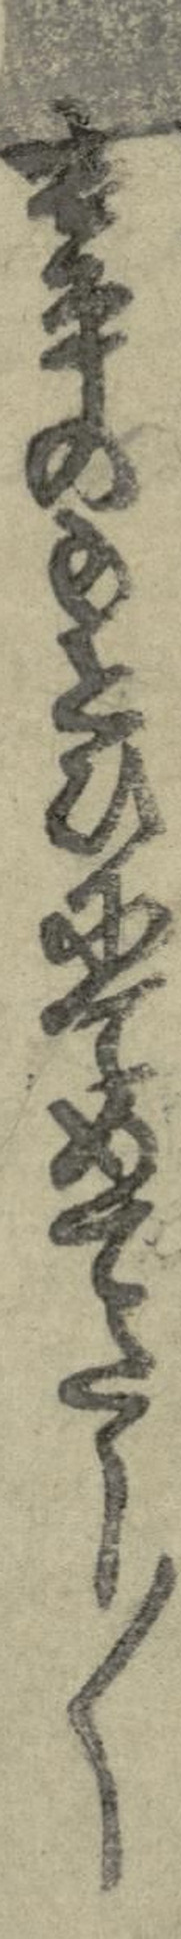太平のもとひにてめてたし〳〵
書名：あんしん要石
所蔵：東京大学地震研究所図書室 Earthquake Research Institute Library, The University of Tokyo, JAPAN
